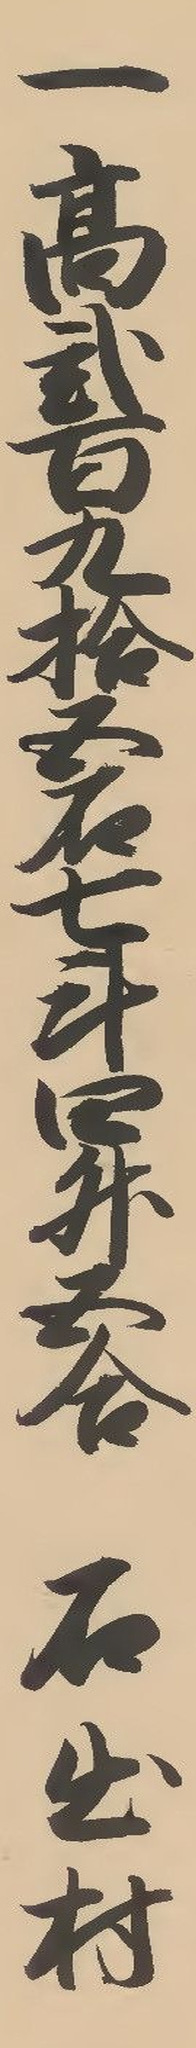一高弐百九拾五石七斗四升五合石出村
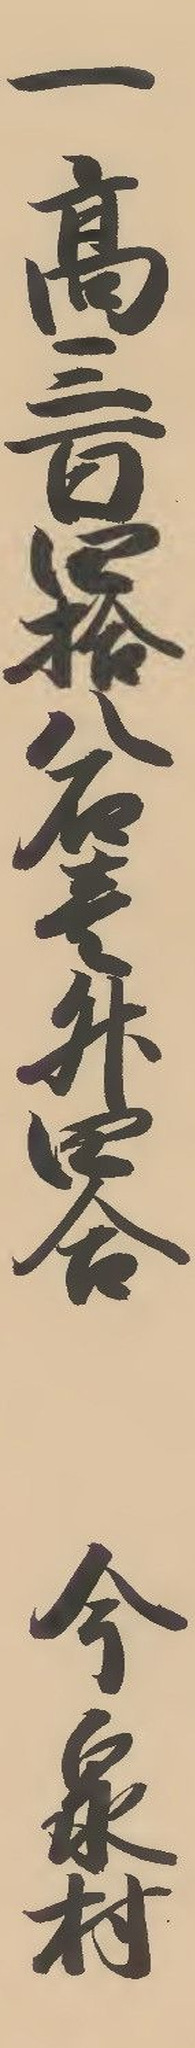一高三百四拾八石壱升四合今泉村

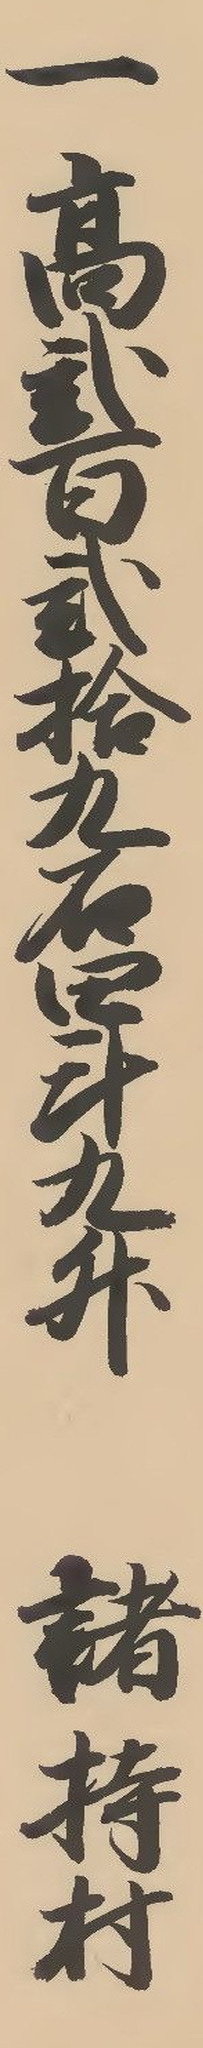一高弐百弐拾九石四斗九升諸持村
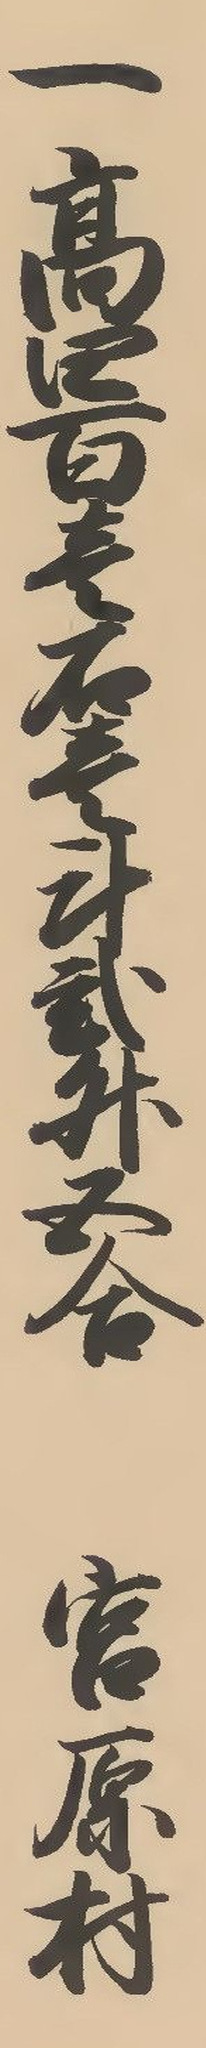一高四百壱石壱斗弐升五合宮原村
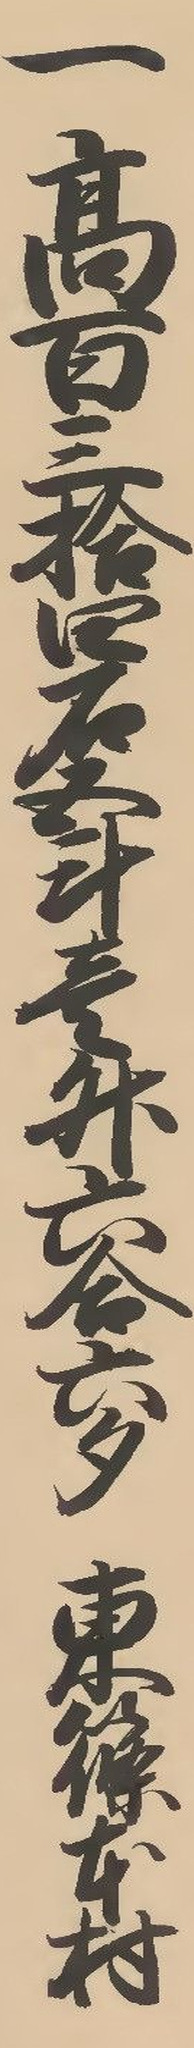一高百三拾四石五斗壱升六合六勺東篠本村
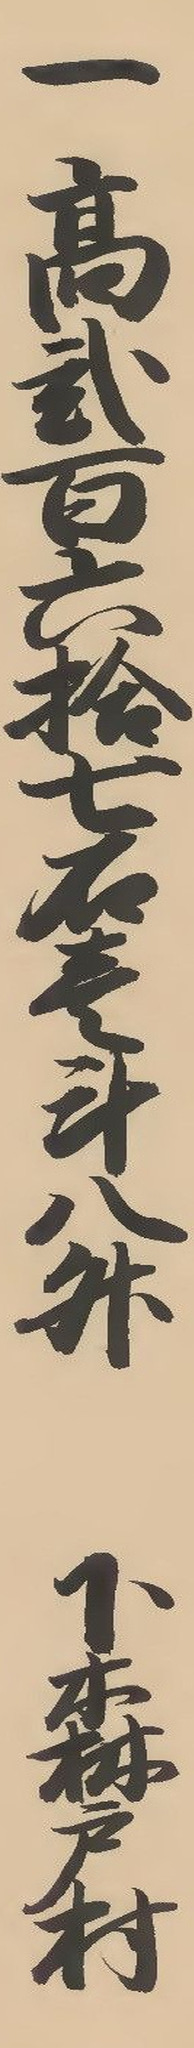一高弐百六拾七石壱斗八升下森戸村
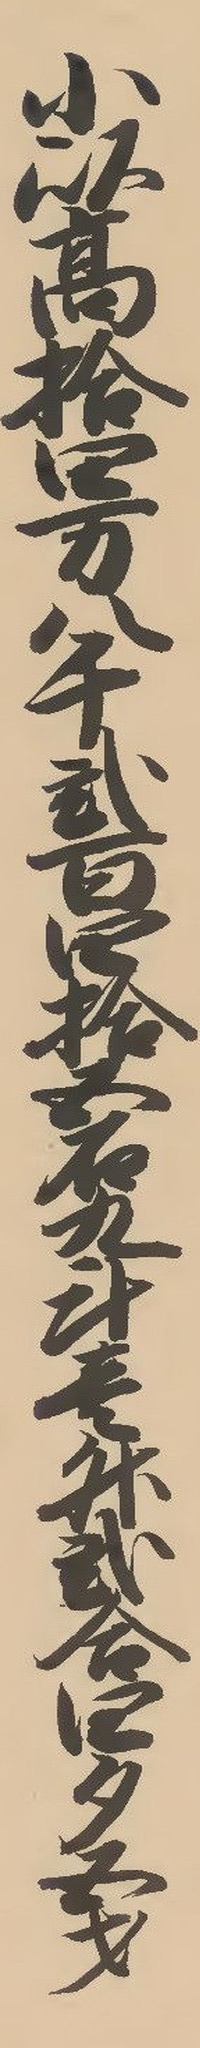小以高拾四万八千弐百四拾五石九斗壱升弐合四勺五才

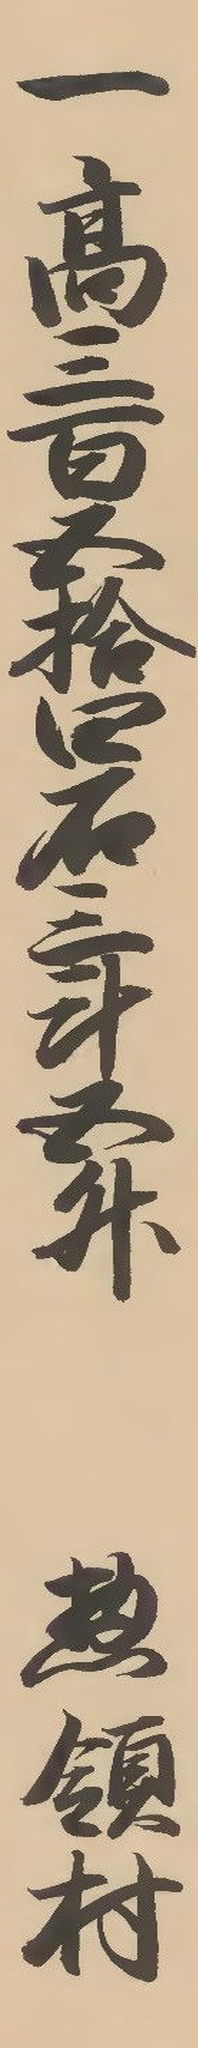一高三百五拾四石三斗五升惣領村
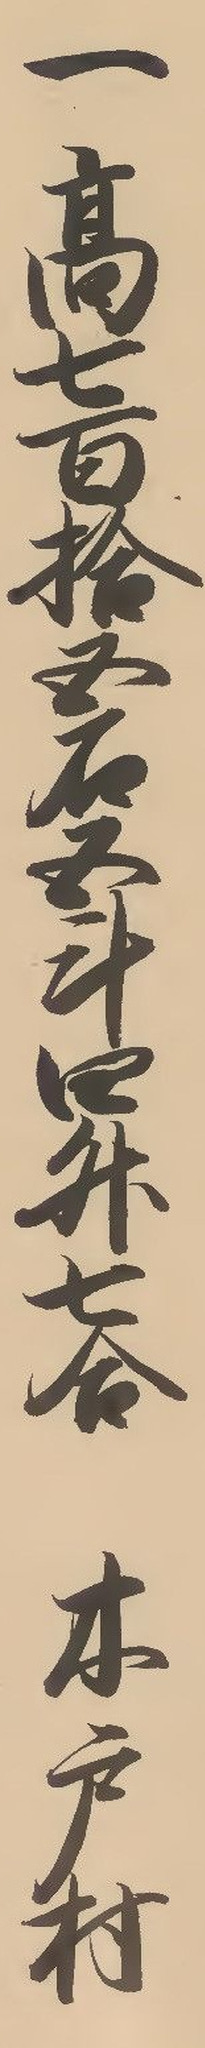一高七百拾五石五斗四升七合木戸村
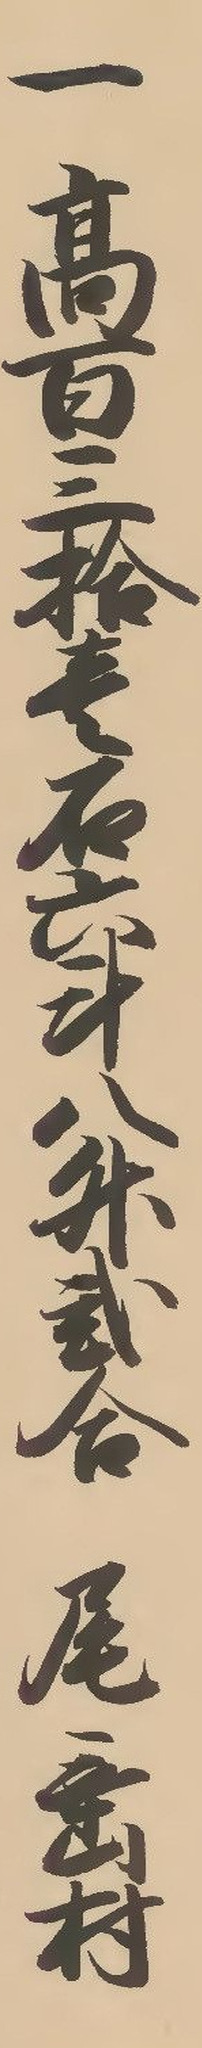一高百三拾壱石六斗八升弐合尾垂村
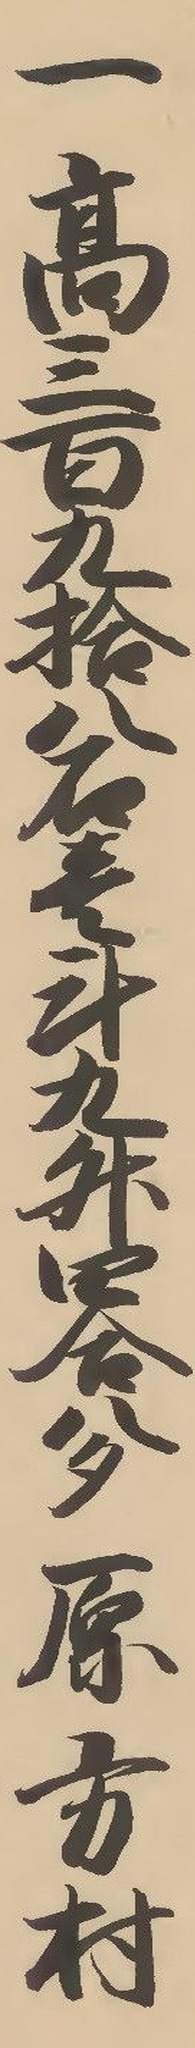一高三百九拾八石壱斗九升四合八勺原方村
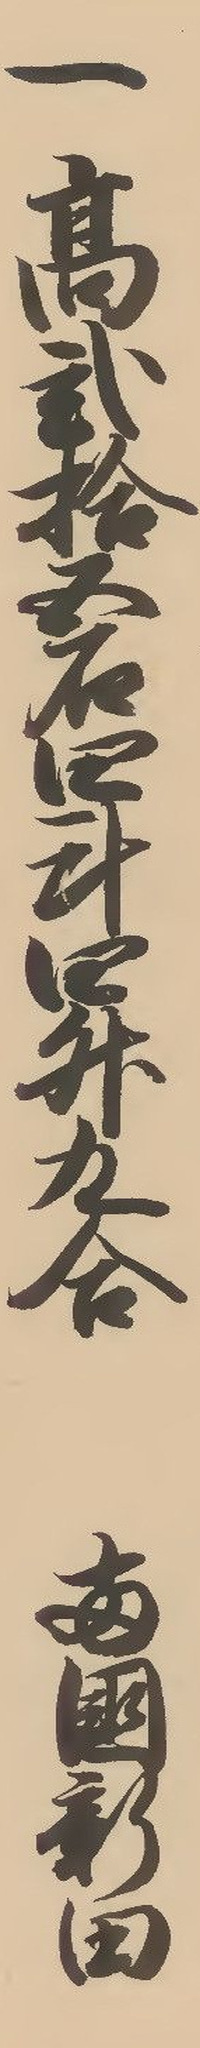一高弐拾五石四斗四升九合両国新田

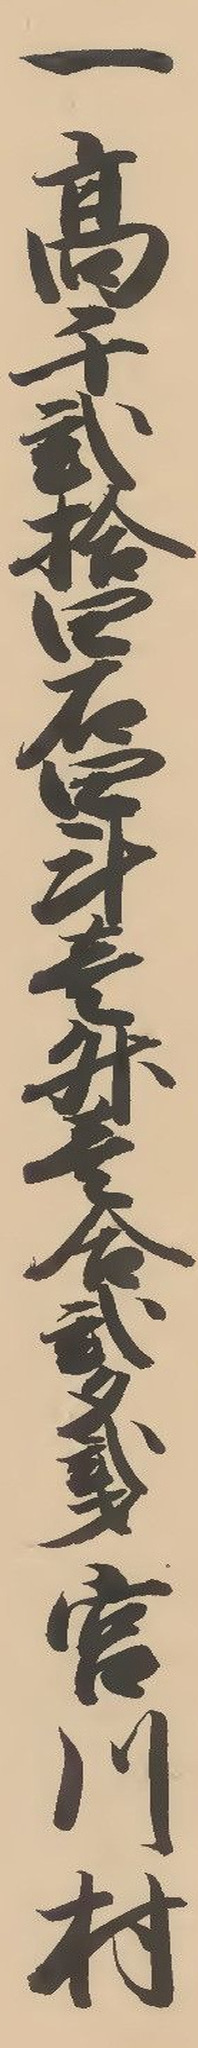一高千弐拾四石四斗壱升壱合弐勺弐才宮川村
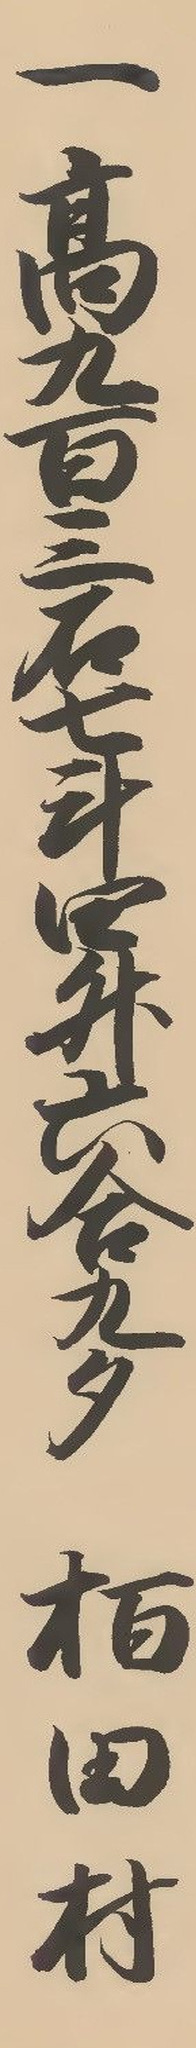一高九百三石七斗四升六合九勺栢田村
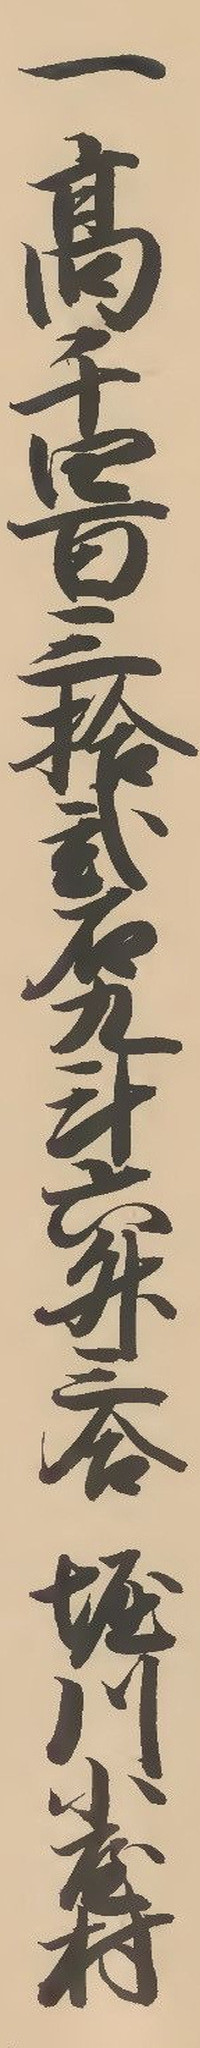一高千四百三拾弐石九斗六升三合堀川小屋村
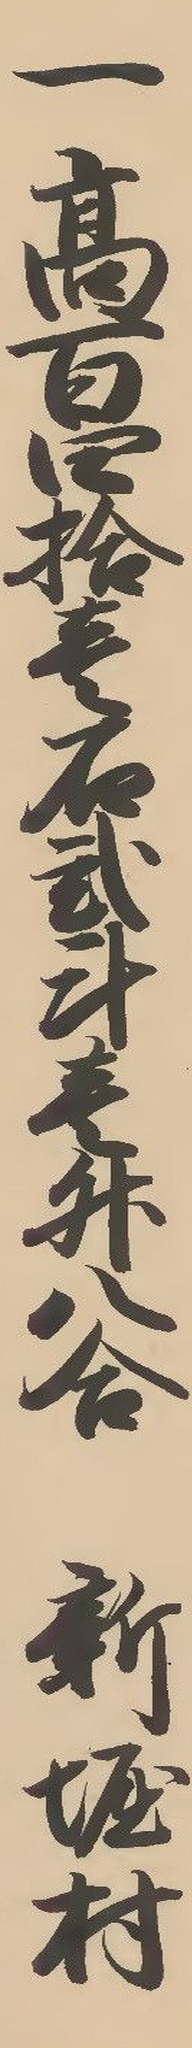一高百四拾壱石弐斗壱升八合新堀村
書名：下総国郷帳
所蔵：国立公文書館 National Archives of Japan
